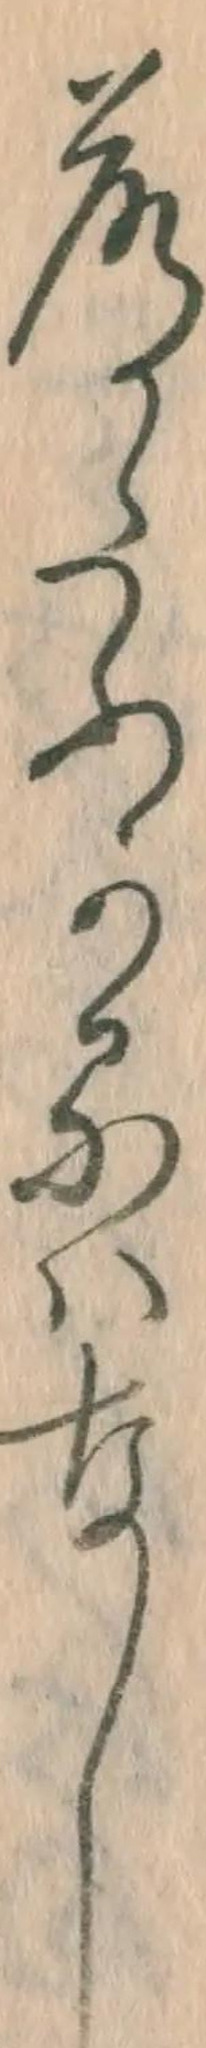落ちたふかるハなし
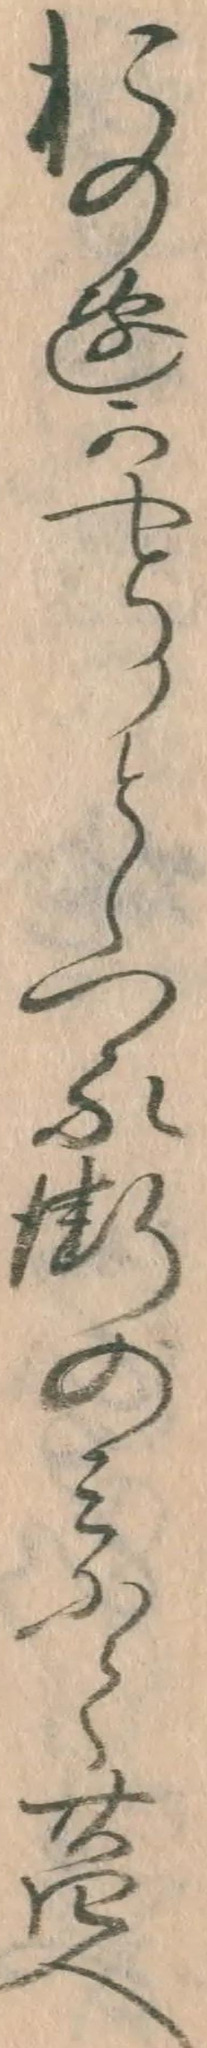おのれかやとりとしつる街のミにて廿四人
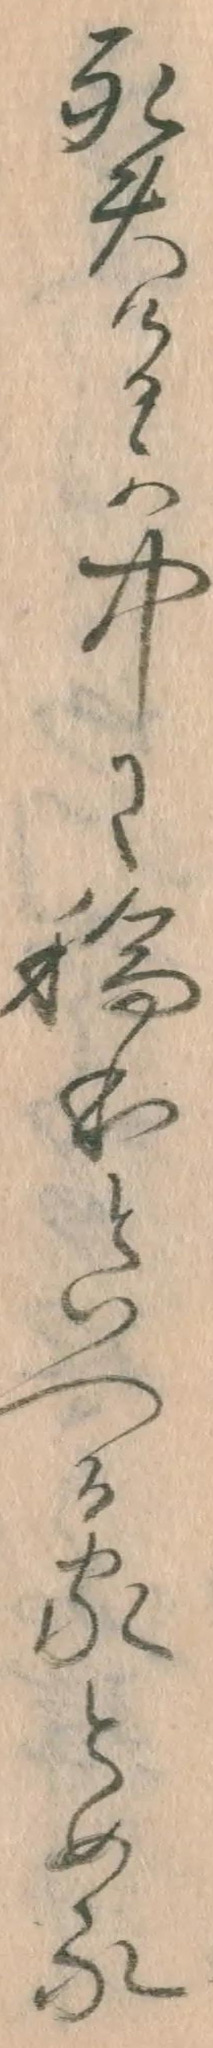死失けるか中に稲本といへる家とめる
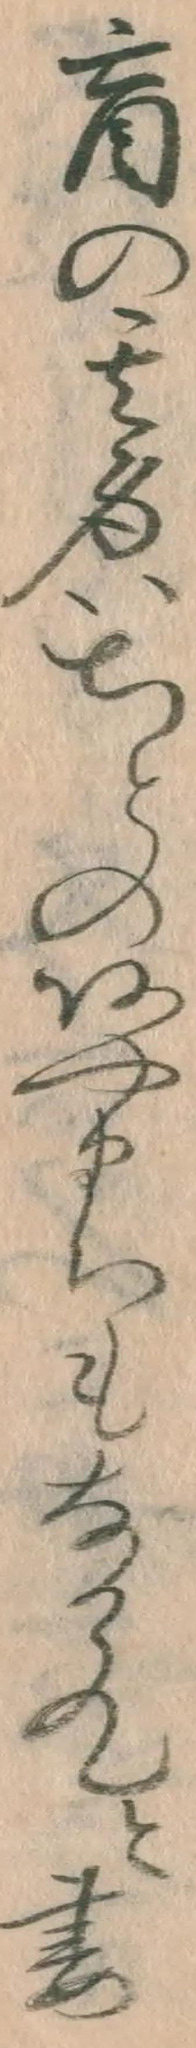盲の其身いちとのあやまちもなかれと妻
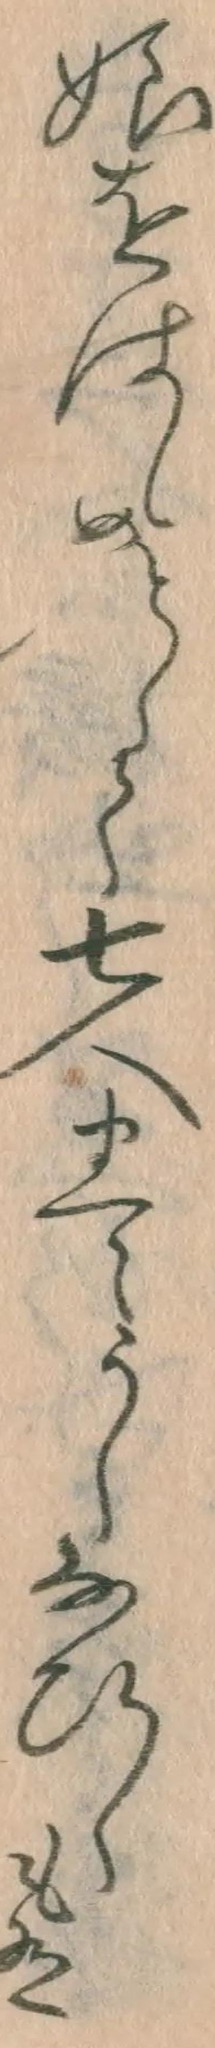娘をはしめとして七人まてうしなひしも有
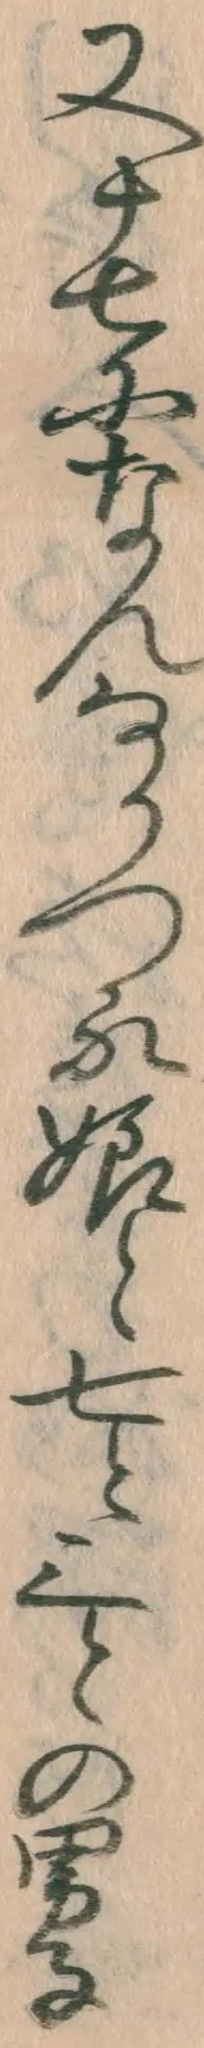又十七になんなりつる娘と七と三との男子
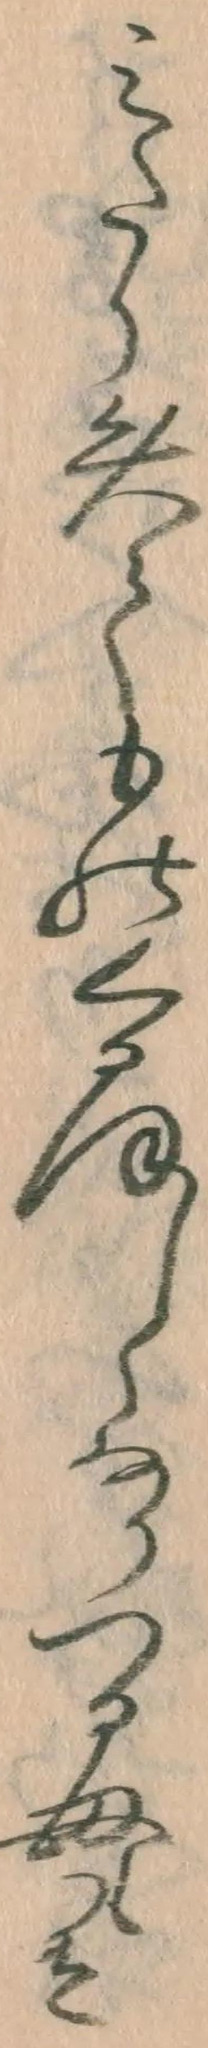ミたり失てものくるほしくなりつる母も有
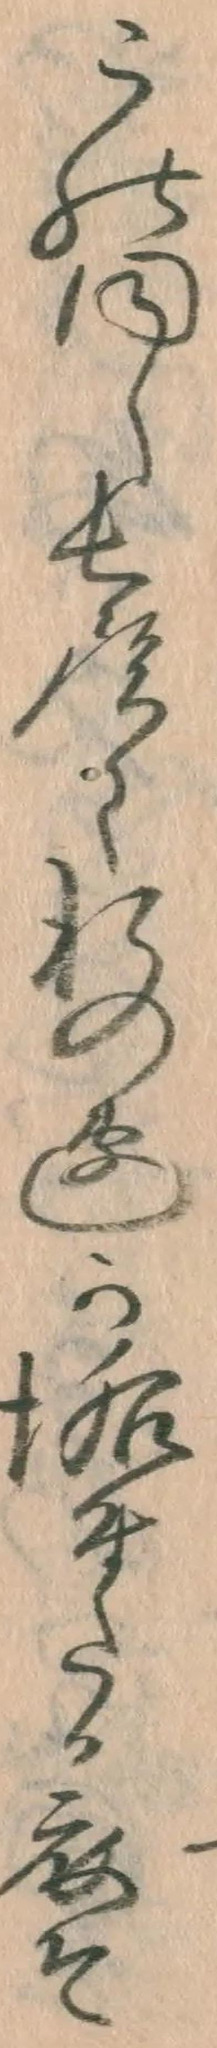この同し長屋におのれか垢付たる衣そ
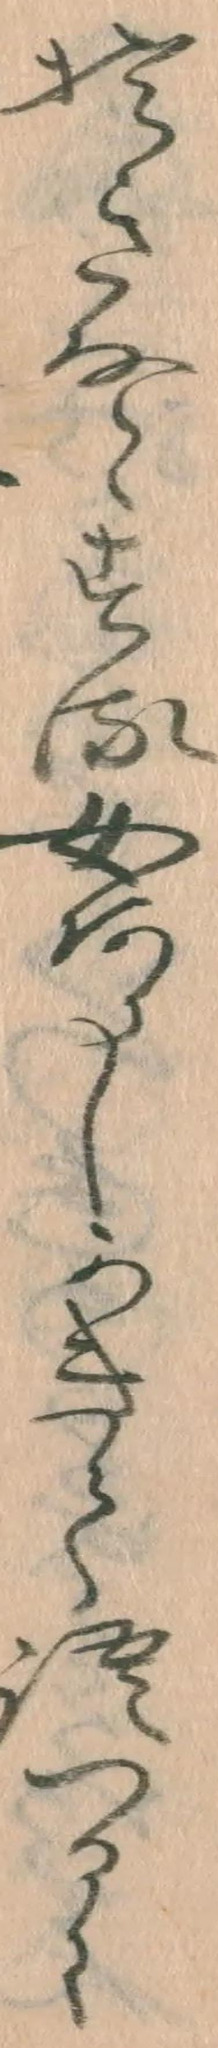そきなとする女ありしかきて語つるに
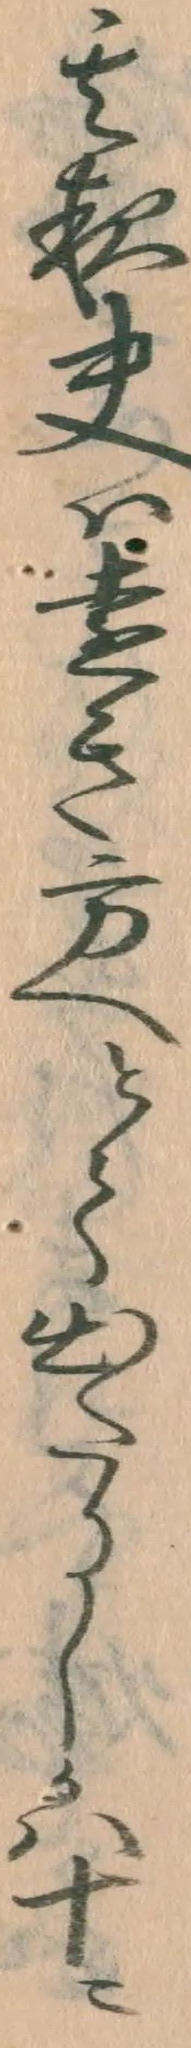其夜夫ハ遠き方へとて出たりしかハ十ニ
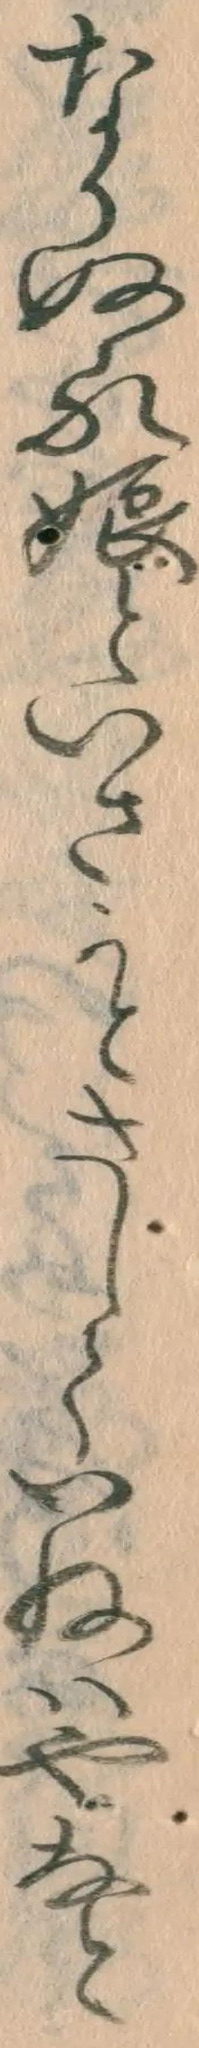なりぬる娘といさうとさしていねハやなと
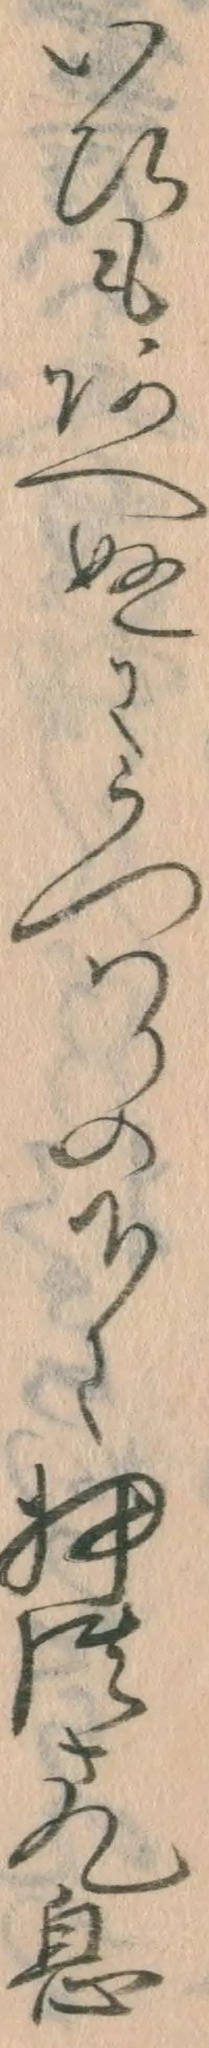いひもあへぬにうつはりの下に押潰され息
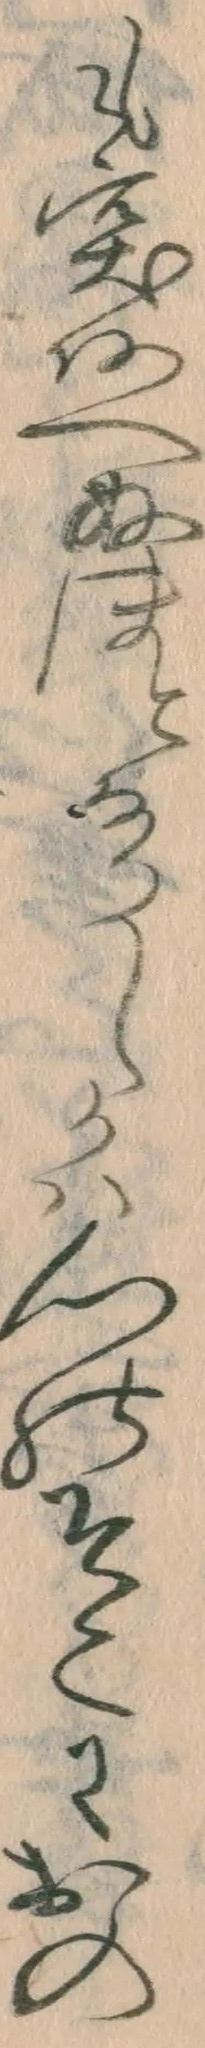も突あへぬほとなりしかハ心のそこにおの
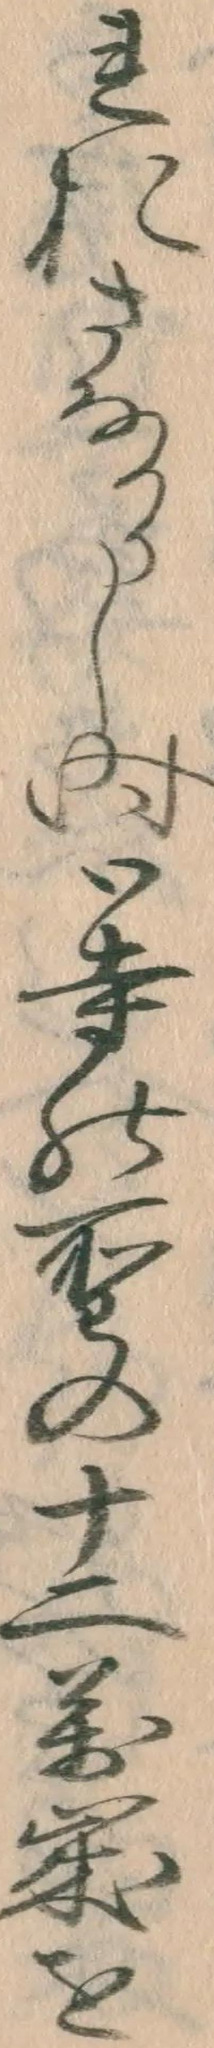れおさなかりし時御寺の聖の十二萬歳を
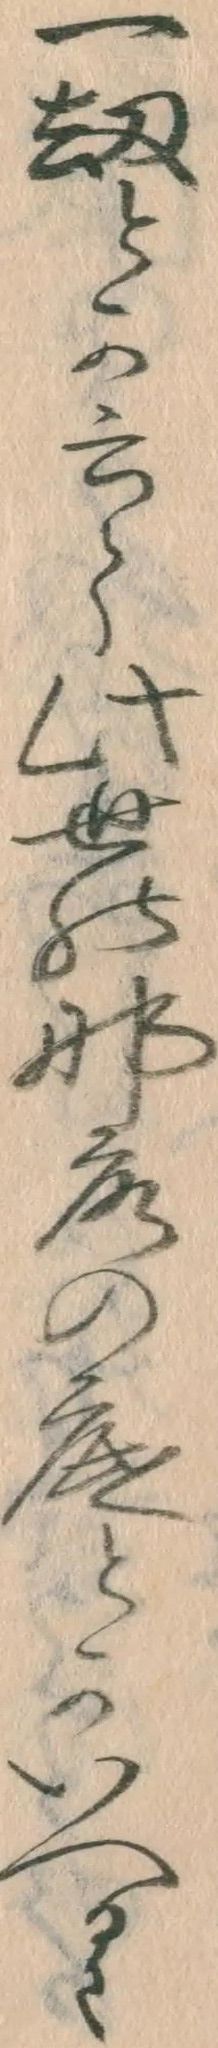一劫とか云て此世の那落の底とかいへるに
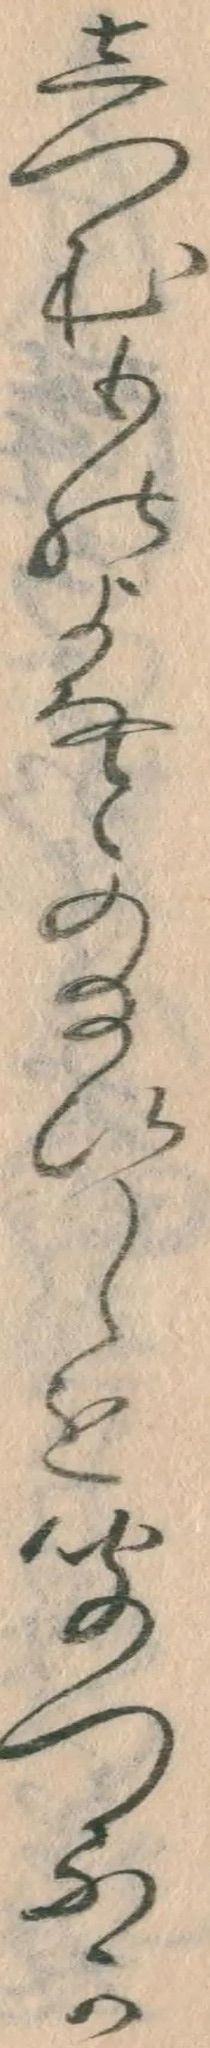しつむものよなとの玉ひしを聞つるか
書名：麗斎叢書. 20
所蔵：国立国会図書館 National Diet Library, JAPAN
